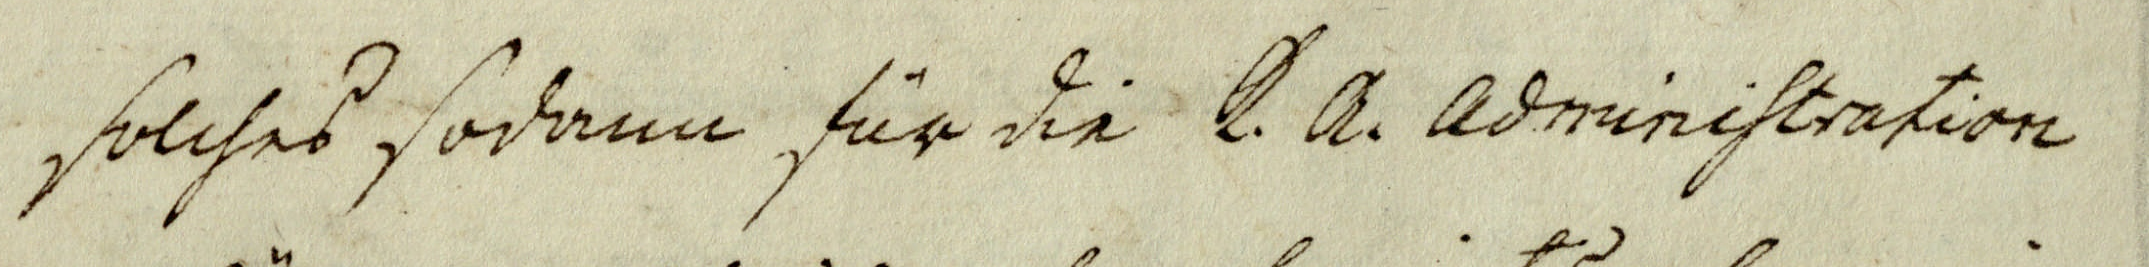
solches sodann für die K. A. Administration
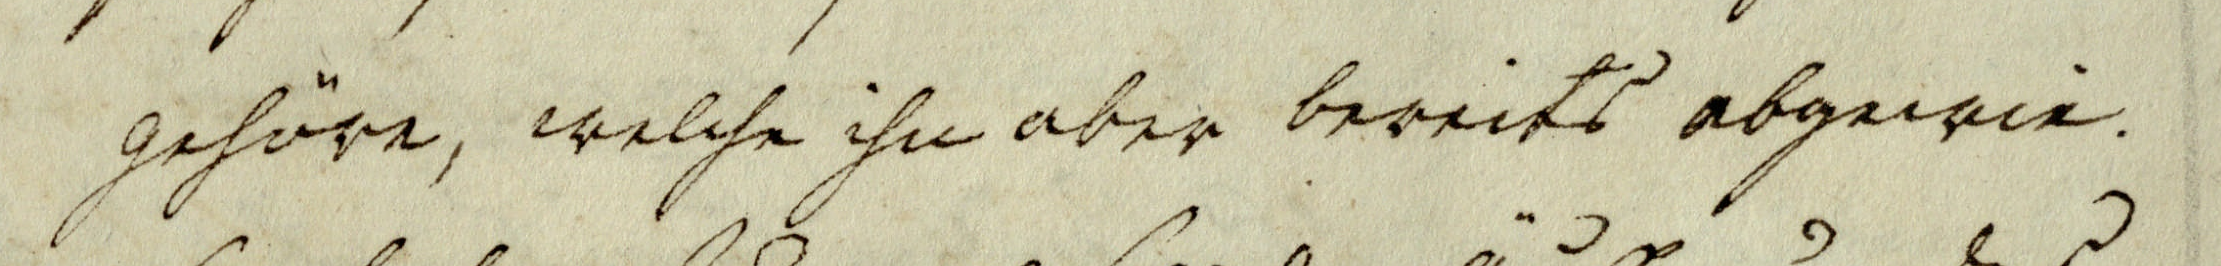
gehöre, welche in aber bereits abgewie¬
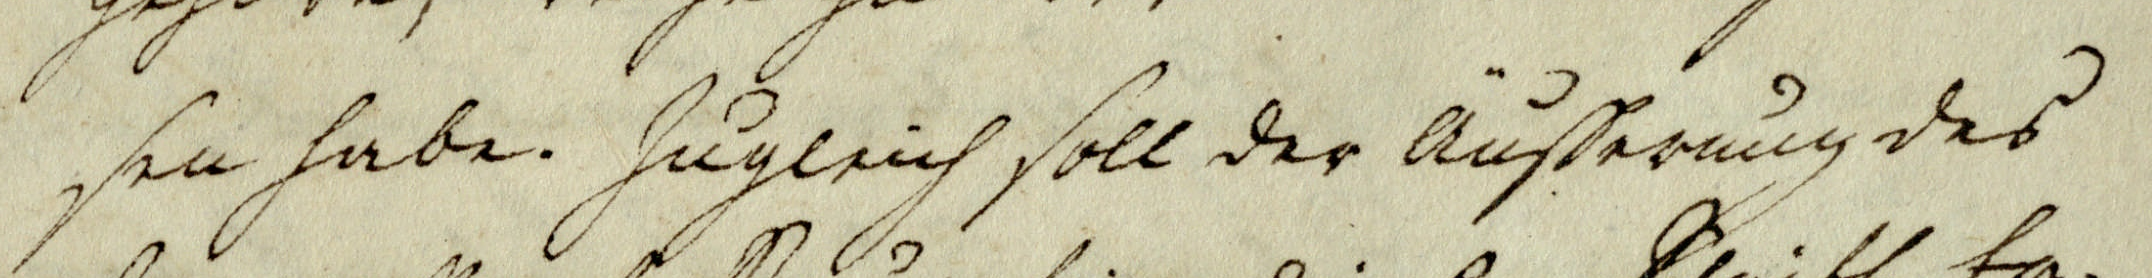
sen habe. Zugleich soll der Äusserung des
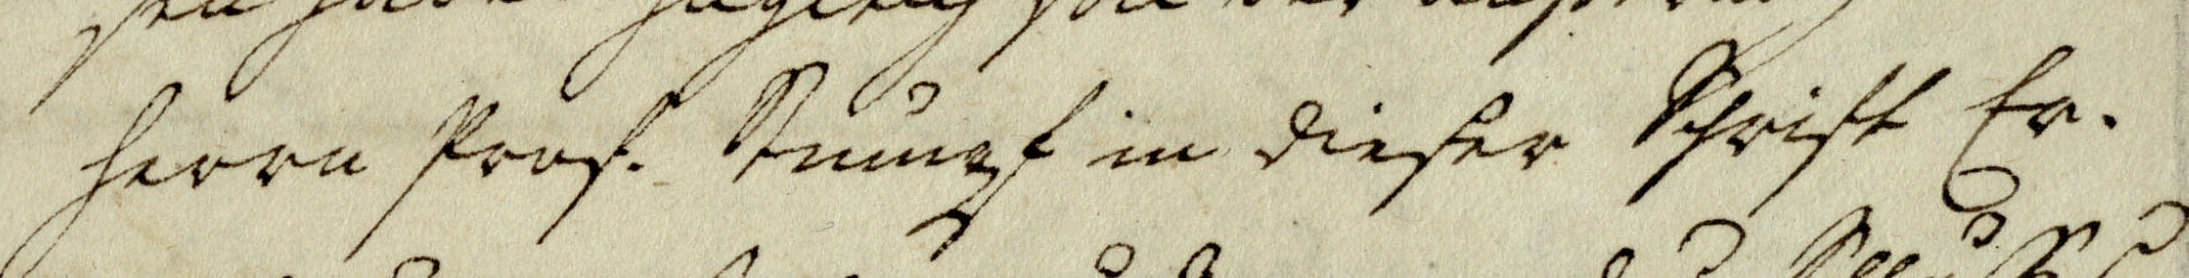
Herrn Prof. Stumpf in dieser Schrift Er¬
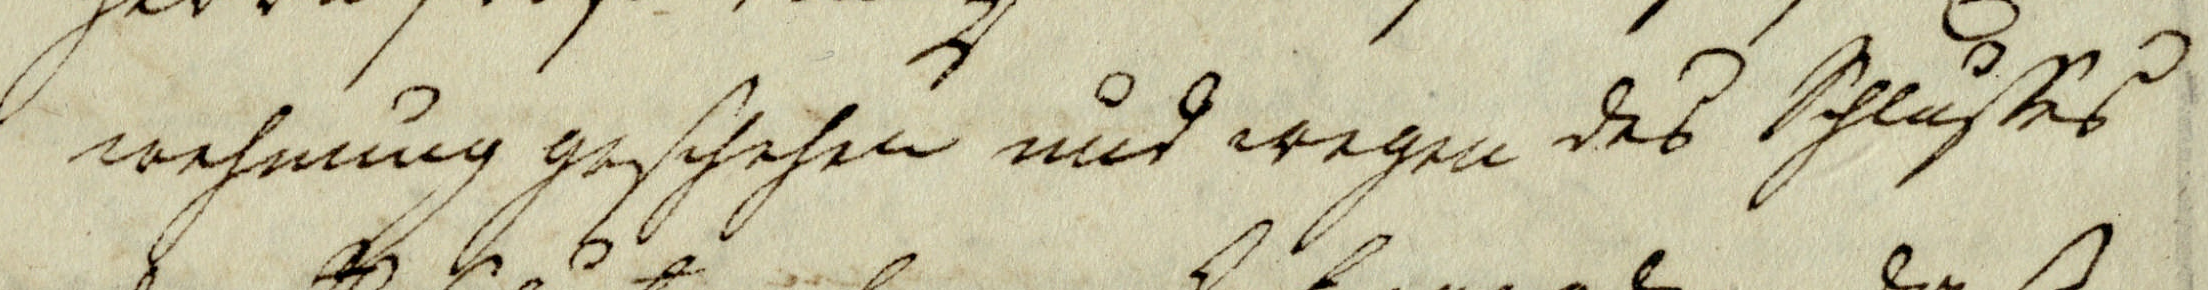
wehnung geschehen und wegen des Schlusses
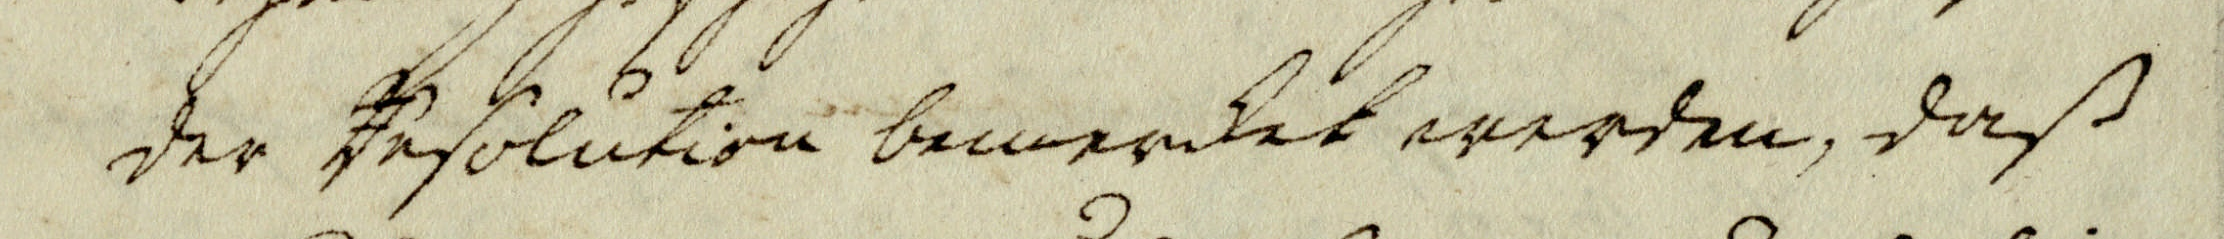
der Resolution bemercket werden, daß
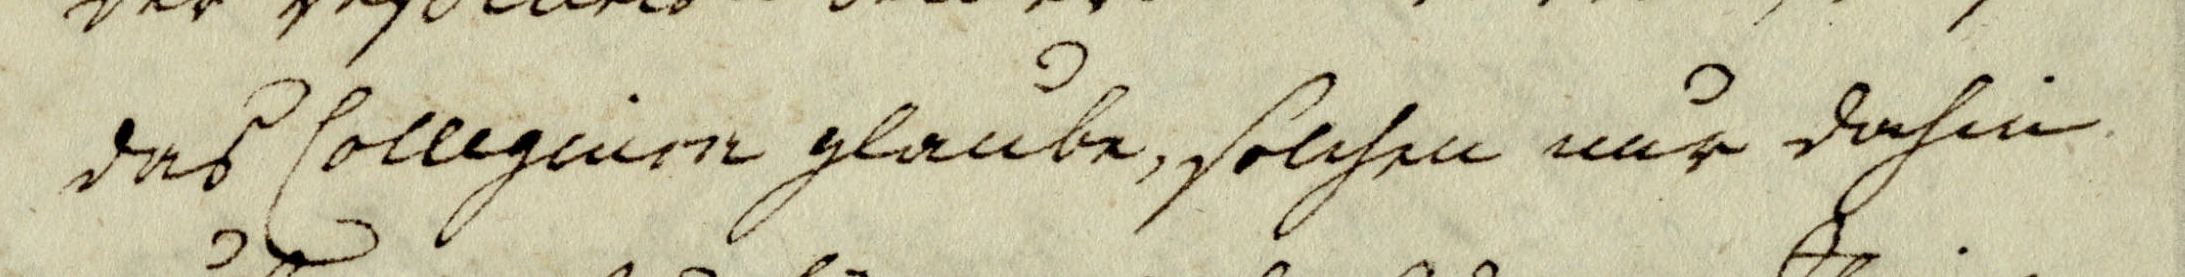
das Collegium glaube, solchen nur dahin
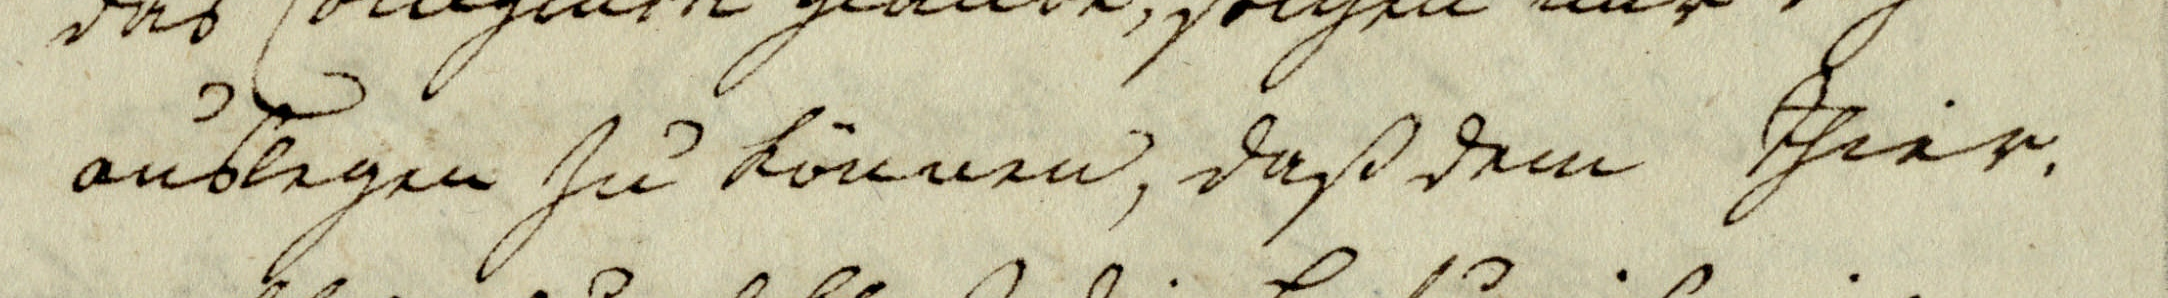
auslegen zu können, daß dem Thier¬
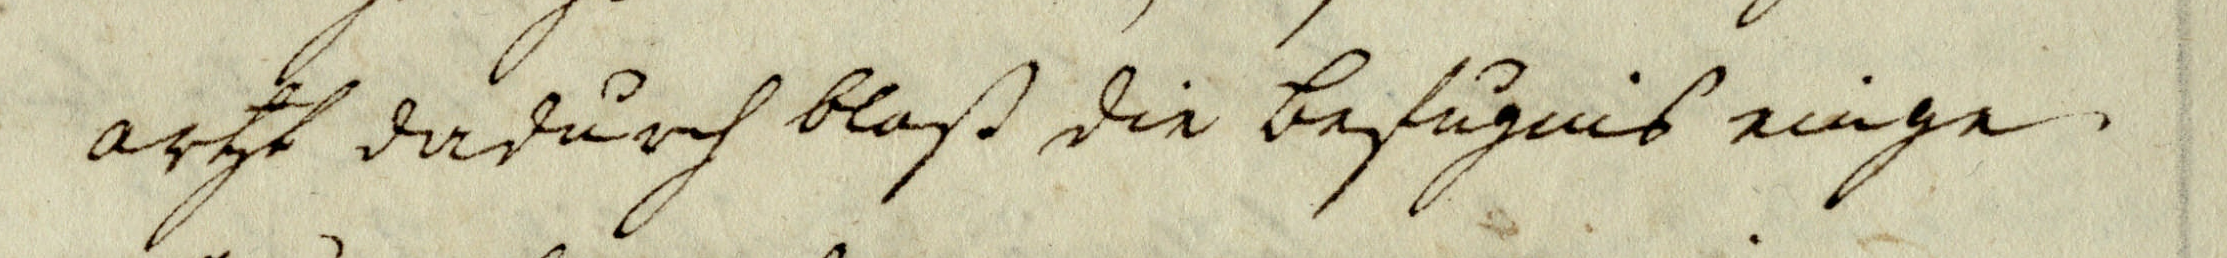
artzt dadurch bloß die Befugis einge¬
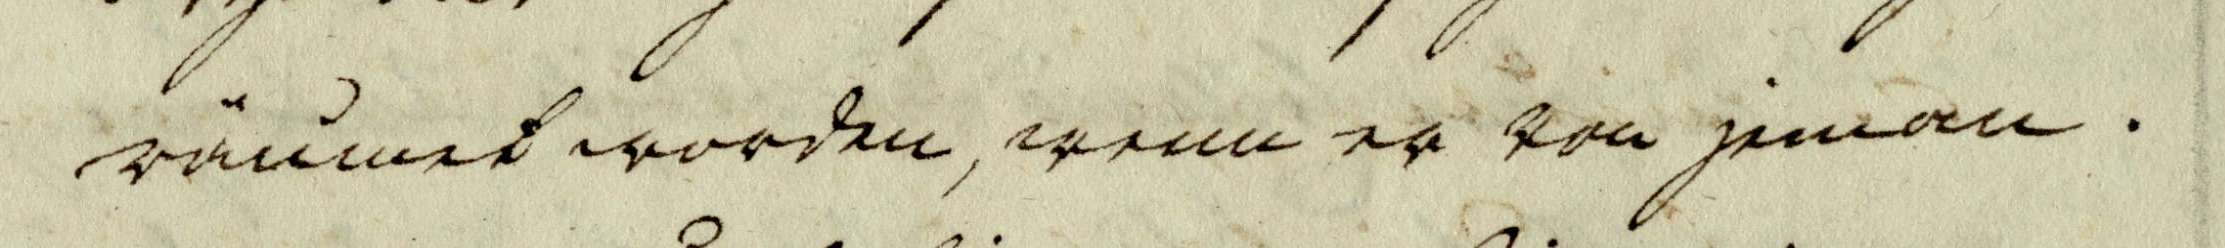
räumet worden, wenn er von jeman¬
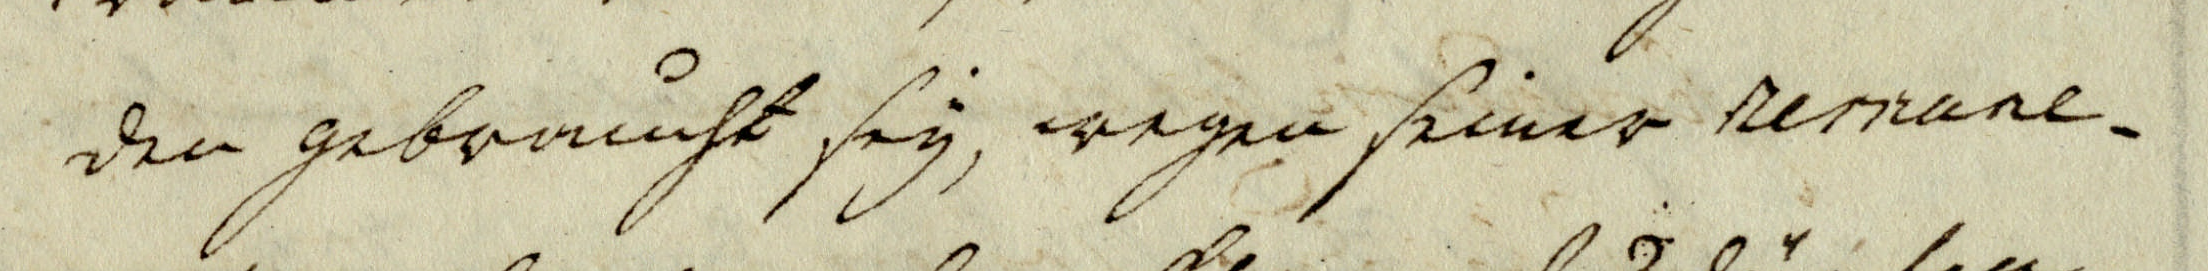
den gebraucht seÿ, wegen seiner remune¬
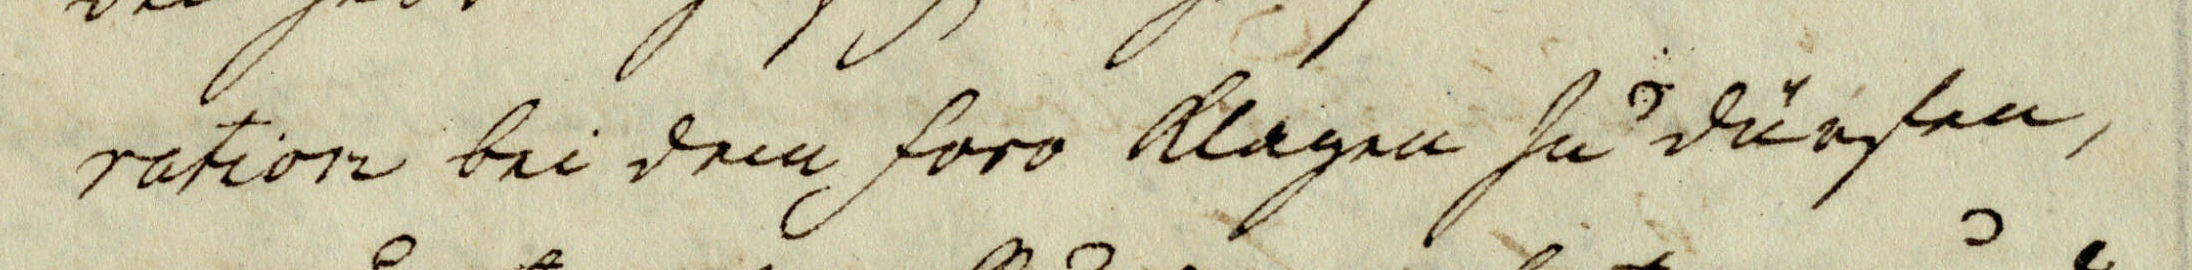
ration bei dem Foro klagen zu dürfen,
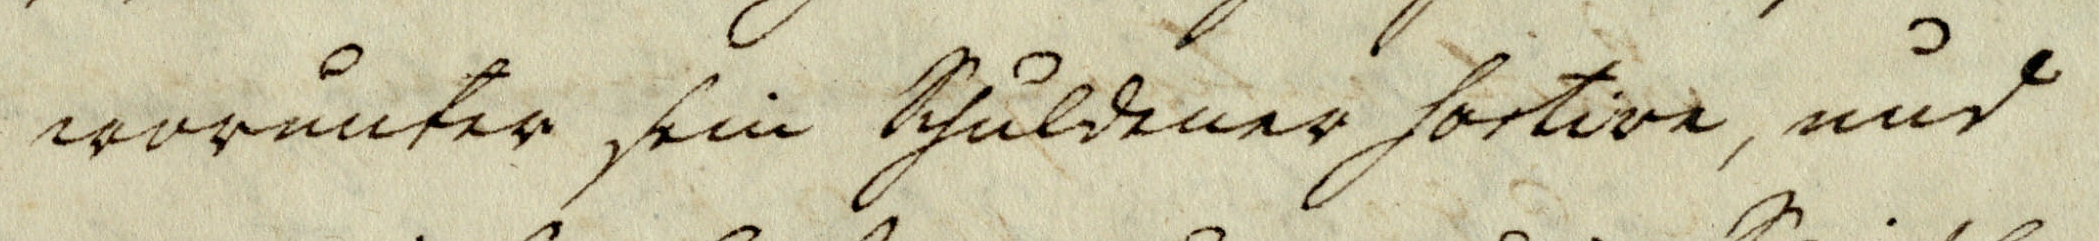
worunter sein Schuldener sortire, und
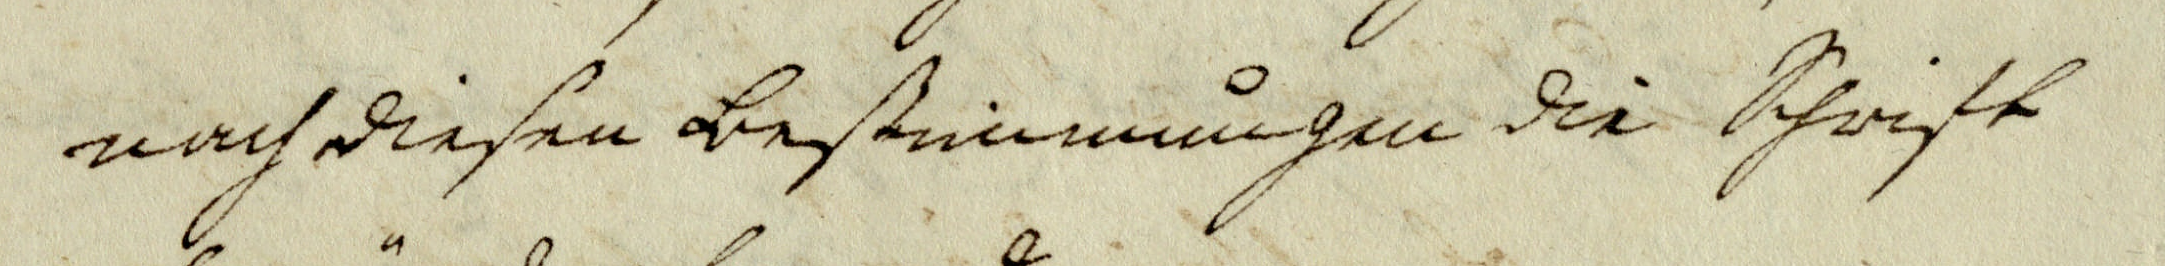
nach diesen Bestimmungen die Schrift
